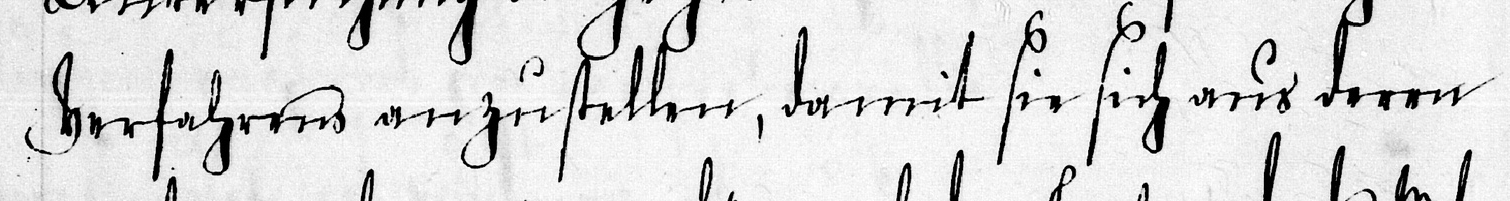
Verfahrens anzustellen, damit sie sich aus deren
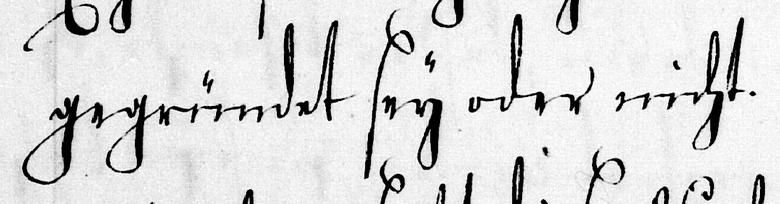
gegründet sey oder nicht.
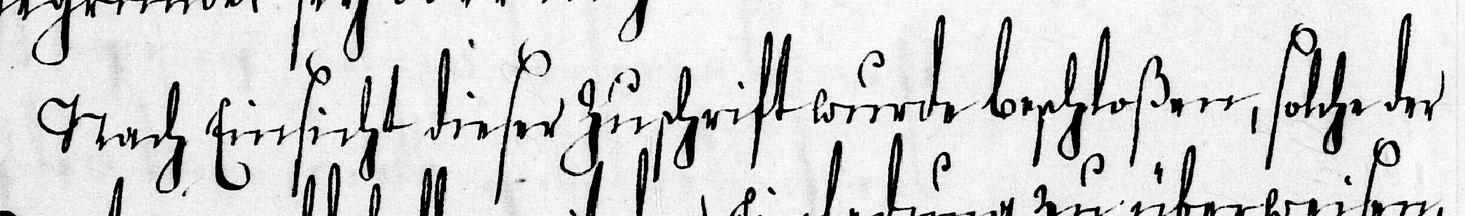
Nach Einsicht dieser Zuschrift wurde beschloßen, solche
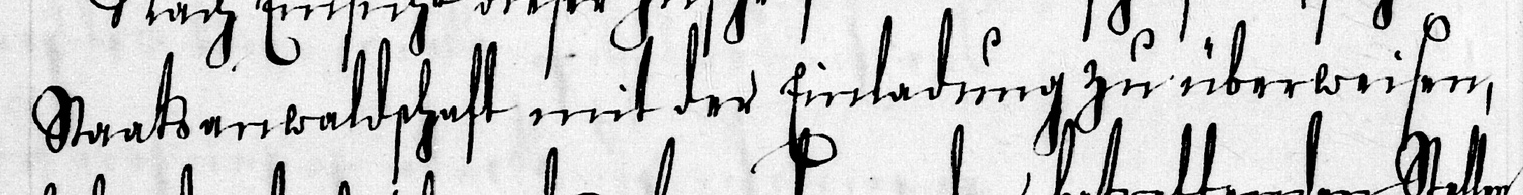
Staatsanwaldschaft mit der Einladung zu überweisen,
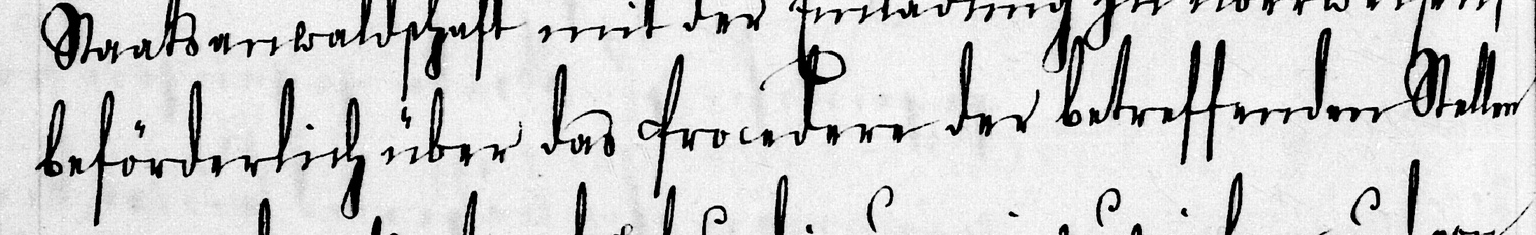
beförderlich über das Procedere der betreffenden Stel¬
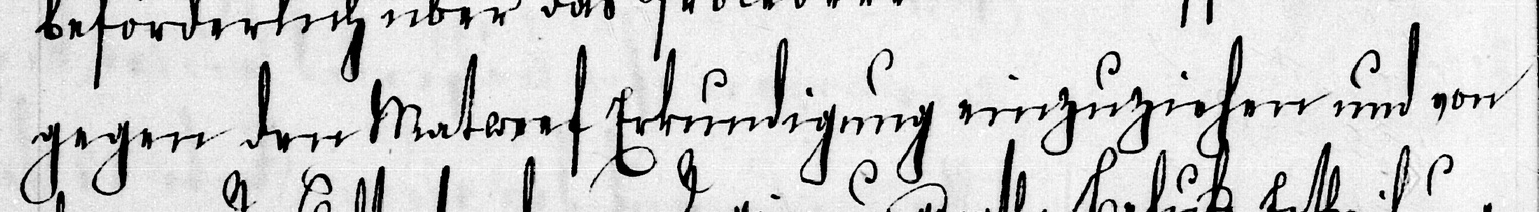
gegen den Matweef Erkundigung einzuziehen und von
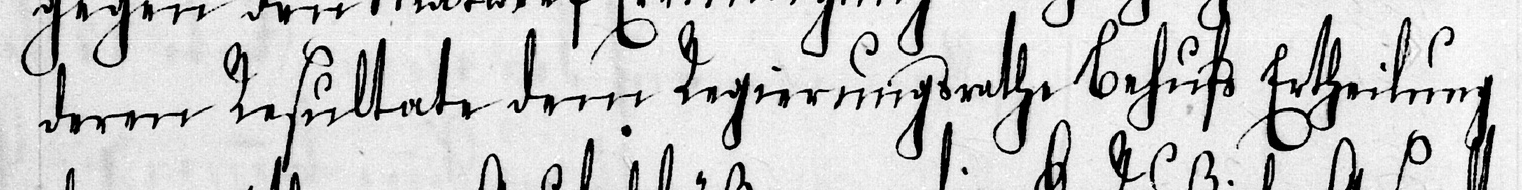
deren Resultate dem Regierungsrathe Behufs Ertheilung
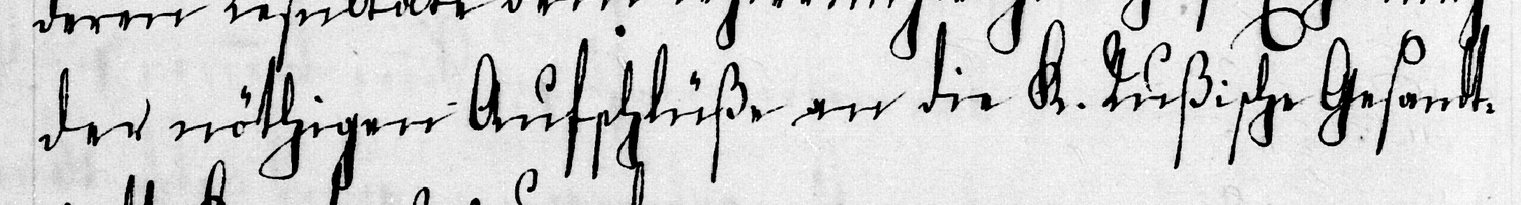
der nöthigen Aufschlüße an die K. Rußische Gesandt¬
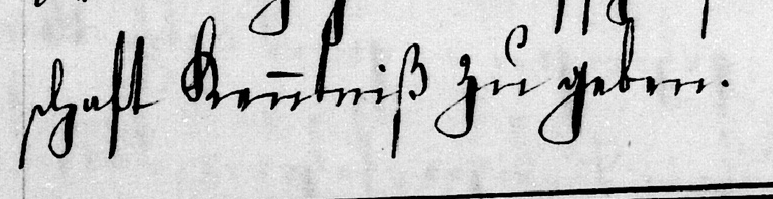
schaft Kenntniß zu geben.
